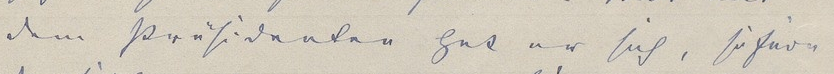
dem Präsidenten hat er sich, sofern
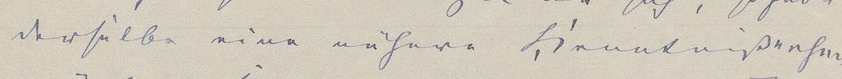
derselbe eine nähere Kenntnißnahme
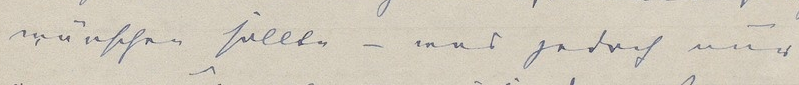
wünschen sollte – was jedoch nur
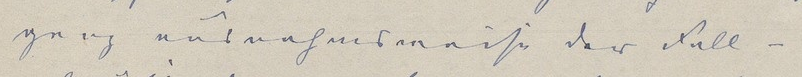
ganz ausnahmsweise der Fall –
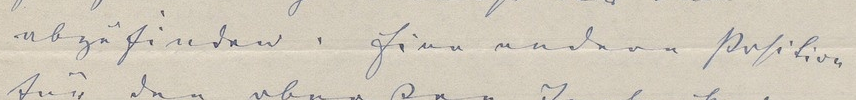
abzufinden. Eine andere Position
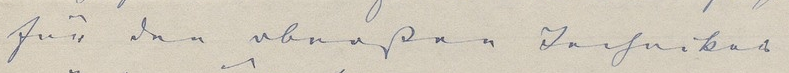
für den obersten Techniker
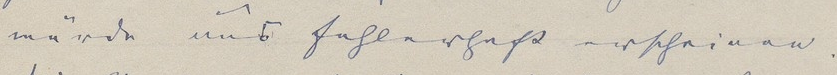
würde uns fehlerhaft erscheinen.
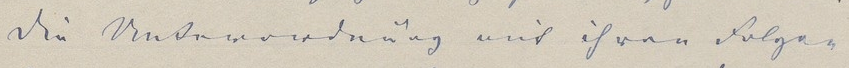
Die Unterordnung mit ihren Folgen
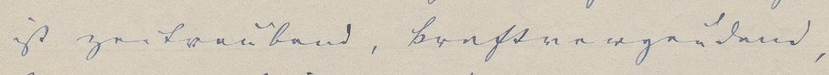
ist zeitraubend, kraftvergeudend,
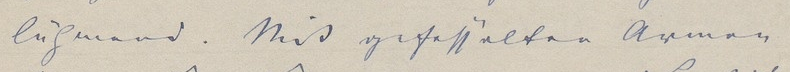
lähmend. Mit gefesselten Armen
